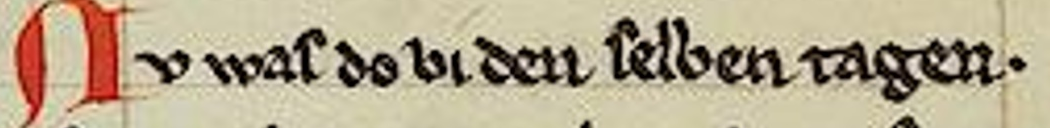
*Nv waſ do bi den ſelben tagen.
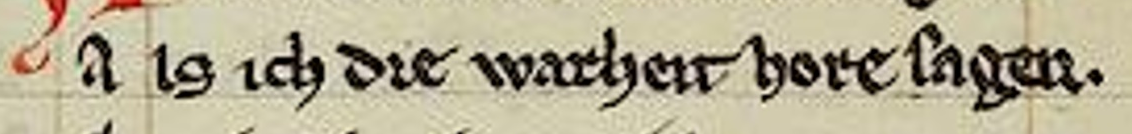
Als ich die warheit hore ſagen.
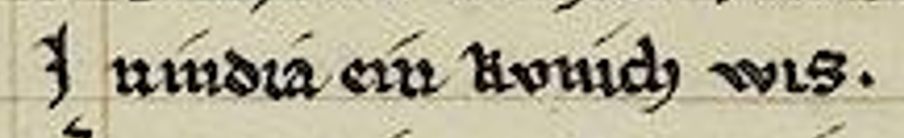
In india ein kvnich wis.
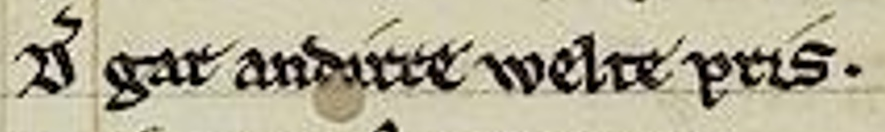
D(er) gar andirre welte pris.
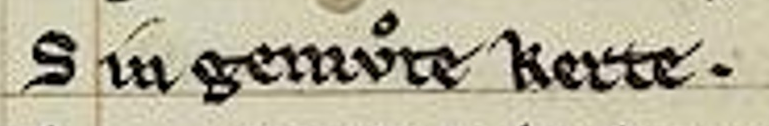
Sin gemv°ote kerte.
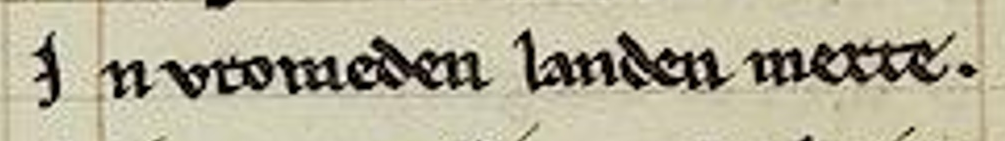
In vromeden landen merte.
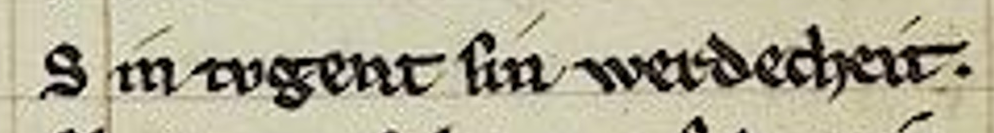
Sin tvgent ſin werdecheit.
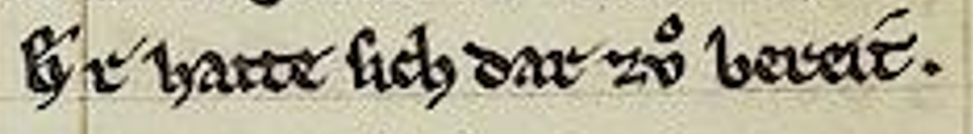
Er hatte ſich dar zv°o bereit.
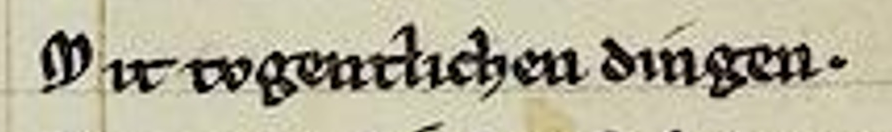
Mit tvgentlichen dingen.
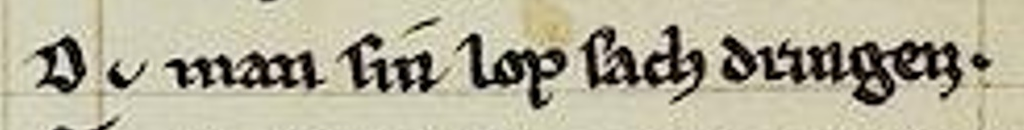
D(az) man ſin lop ſach dringen.
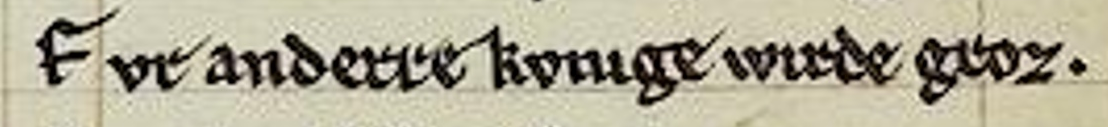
Fvr anderre kvnige wirde groz.
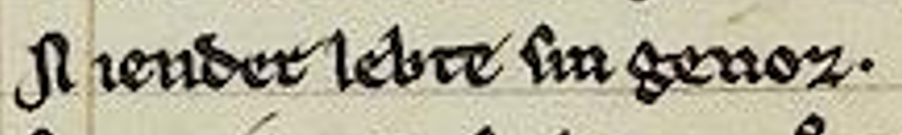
Niender lebte ſin genoz.
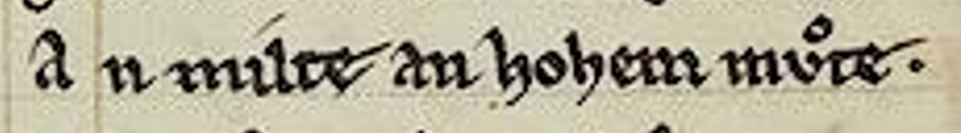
An milte an hohem mv°ote.
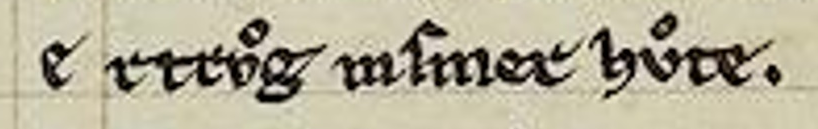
Ertrv°og in ſiner hv°ote.
